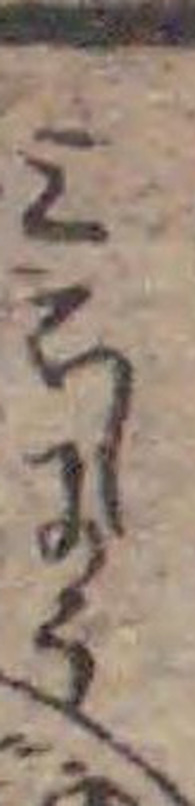みこしにう
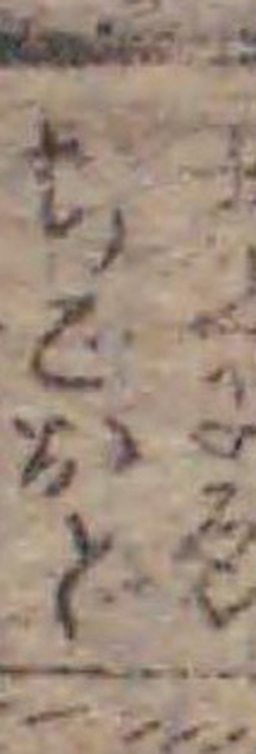ちごおと
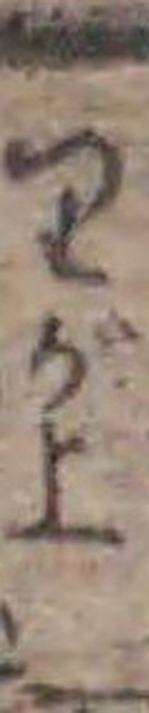りが上
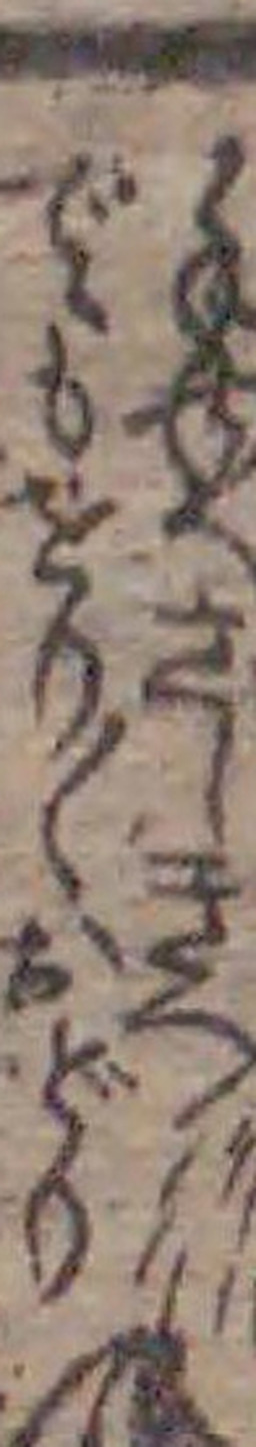でもおり〳〵おどり
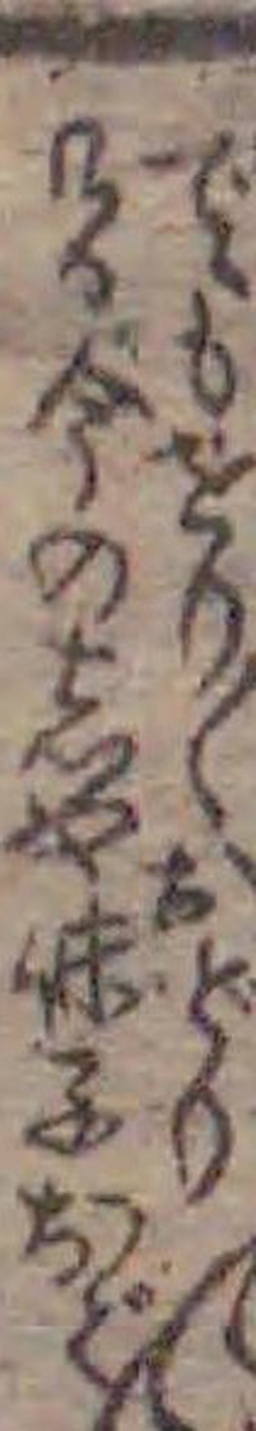ける今のしや味子おど

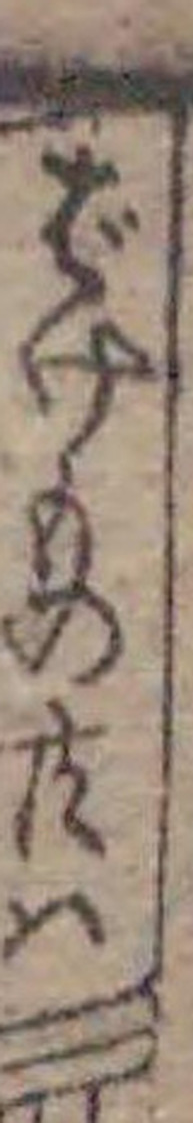ばけもの共は
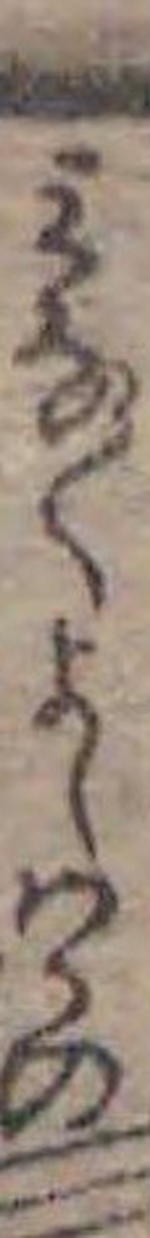みな〳〵よしはらの
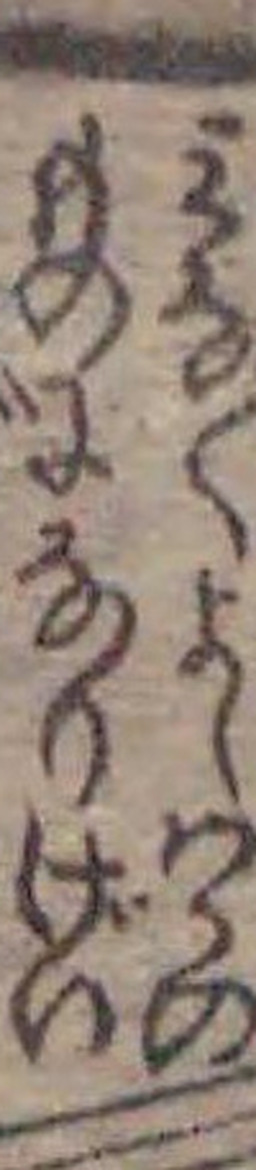ものになりげい
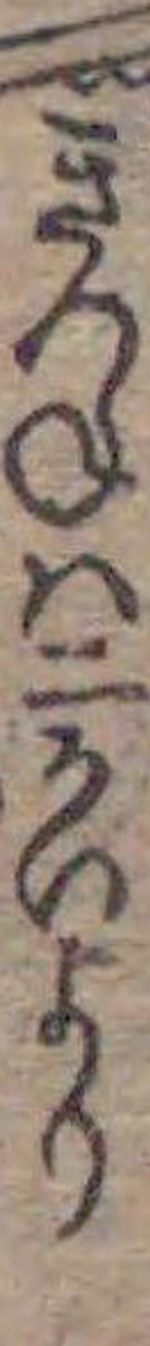〽きつねは二かいより
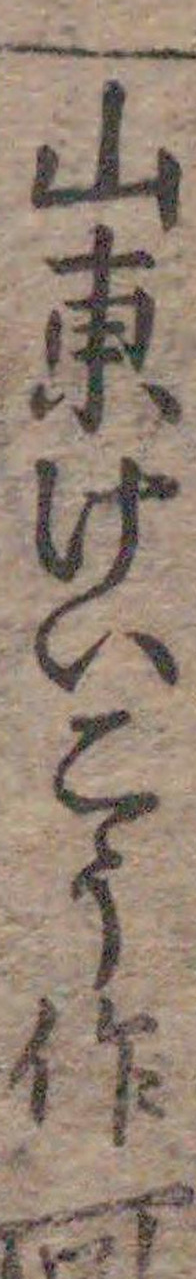山東けいこう作回
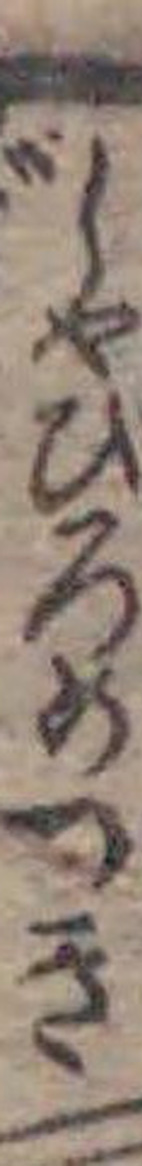しやびろめつき
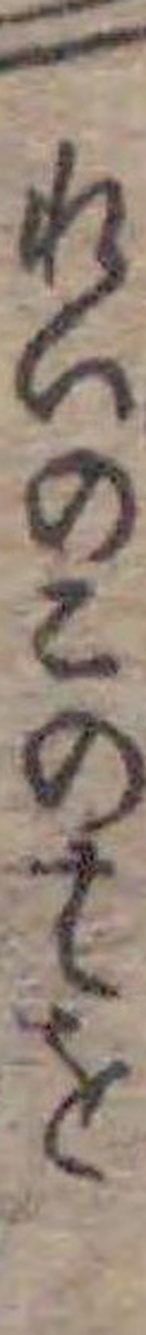れいのこのはを
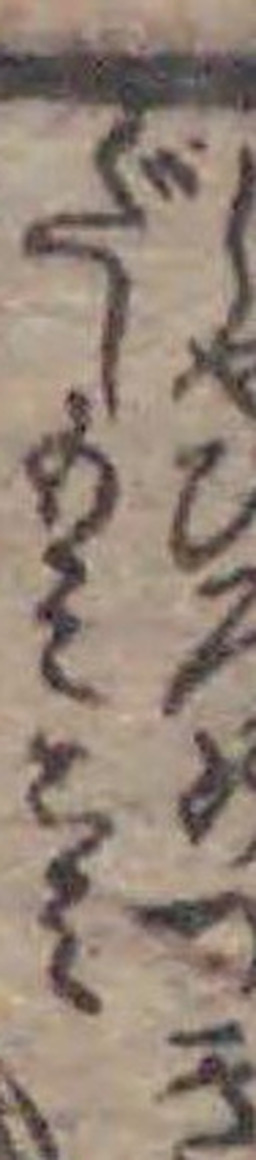だしもみこみ
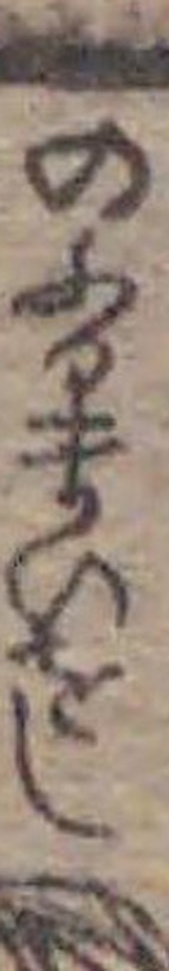のふるまいをし
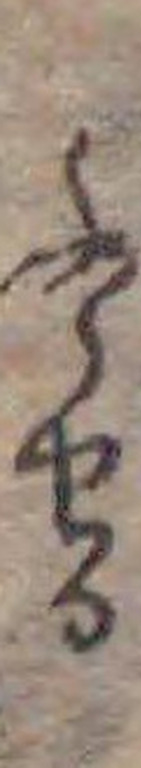ふらせる
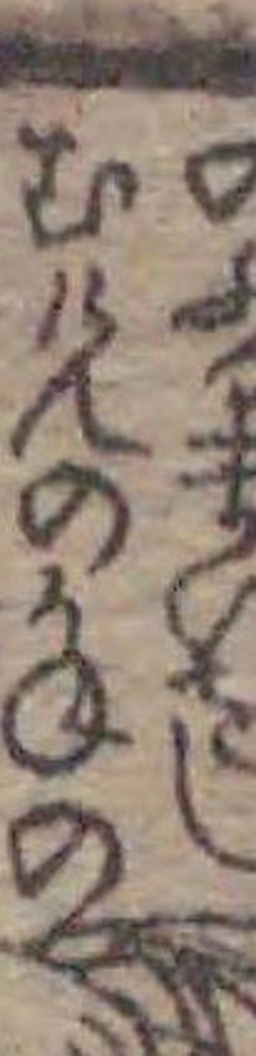むけんのかねの
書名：化物楽屋異牒 : 2巻
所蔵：国立国会図書館 National Diet Library, JAPAN
